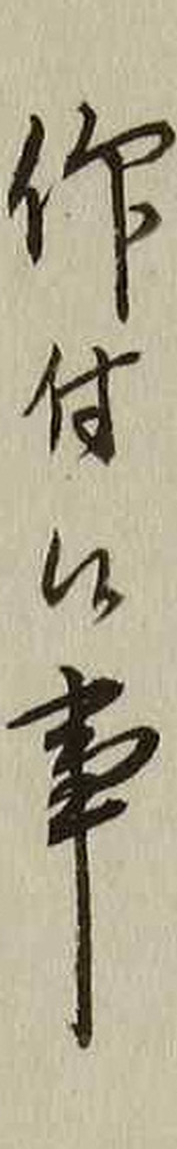仰付候事
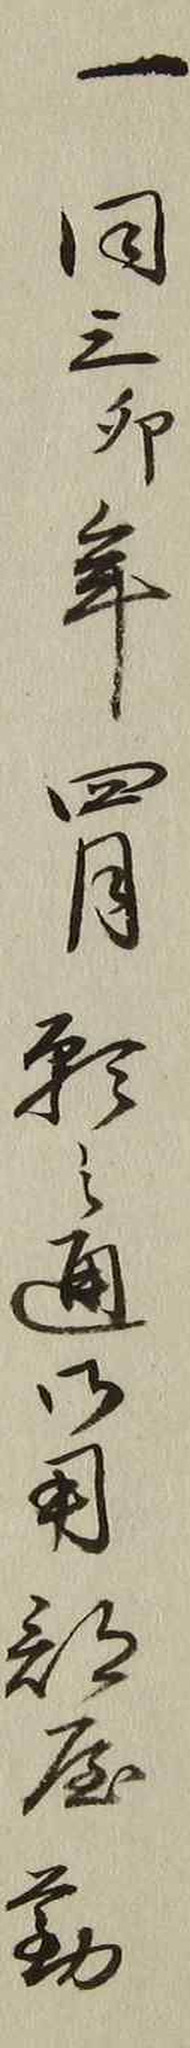一同三卯年四月願之通御用部屋勤
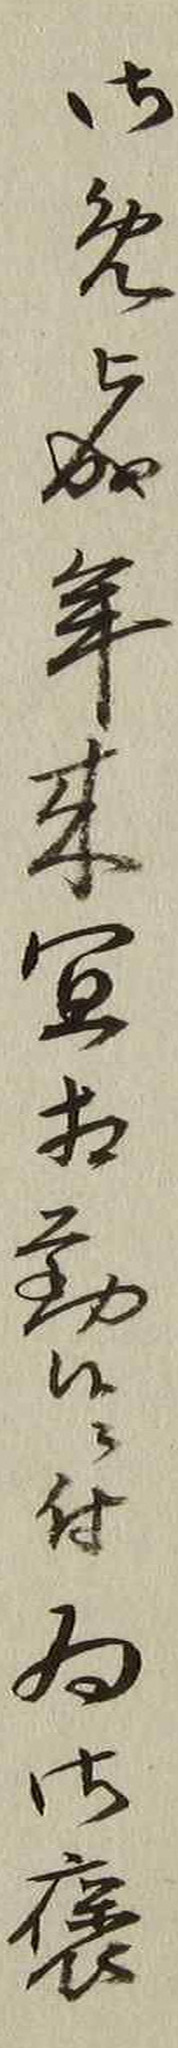御免被成年来宜相勤候ニ付為御褒
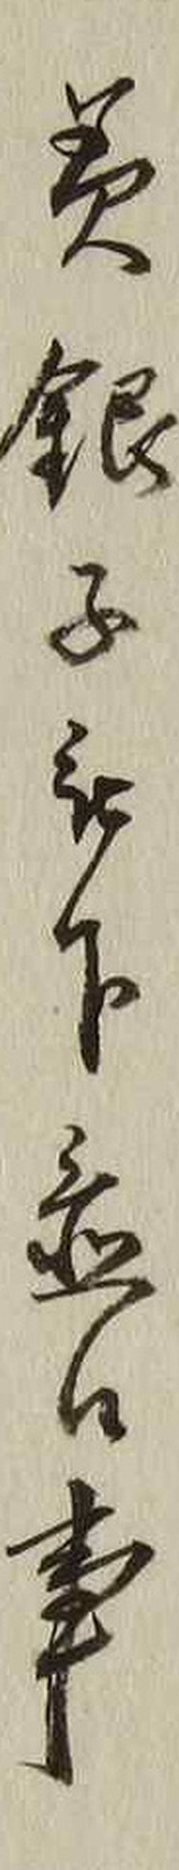美銀子被下置候事
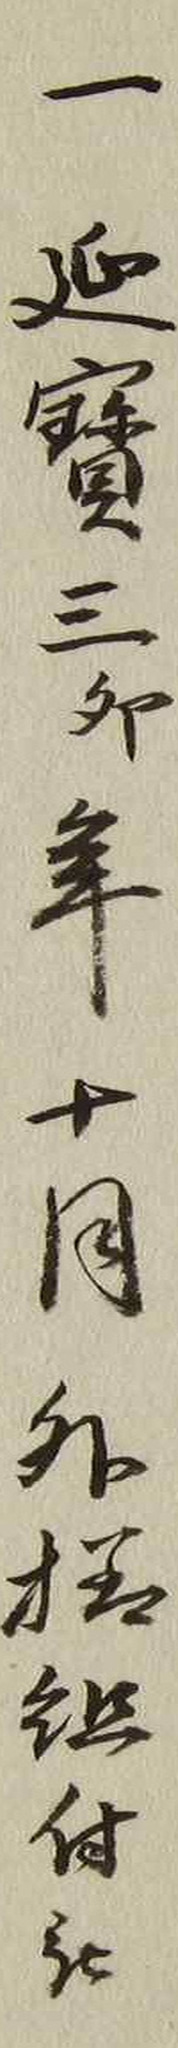一延宝三卯年十月外様組付被
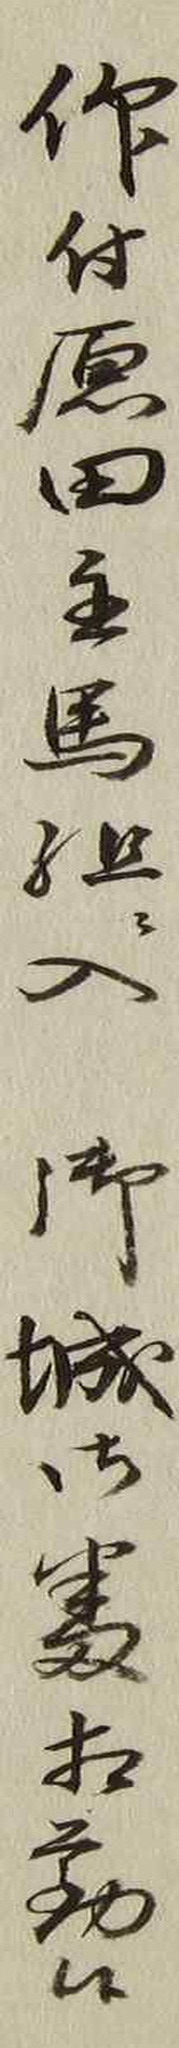仰付原田主馬組ニ入御城御番相勤候
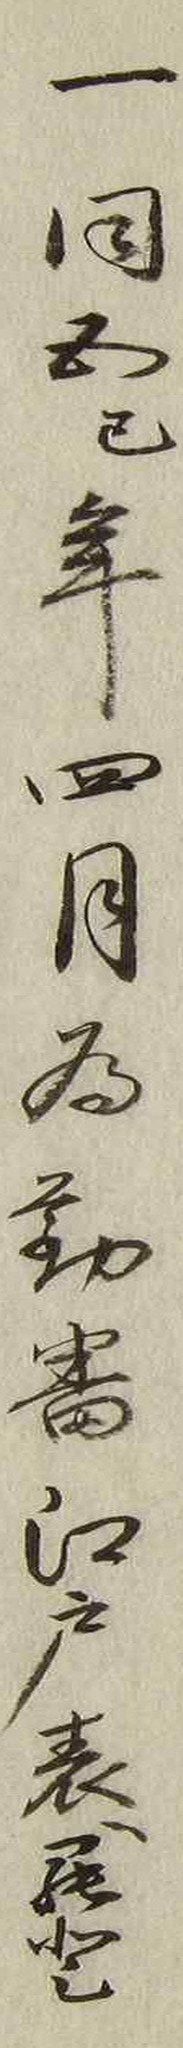一同五巳年四月為勤番江戸表へ罷登
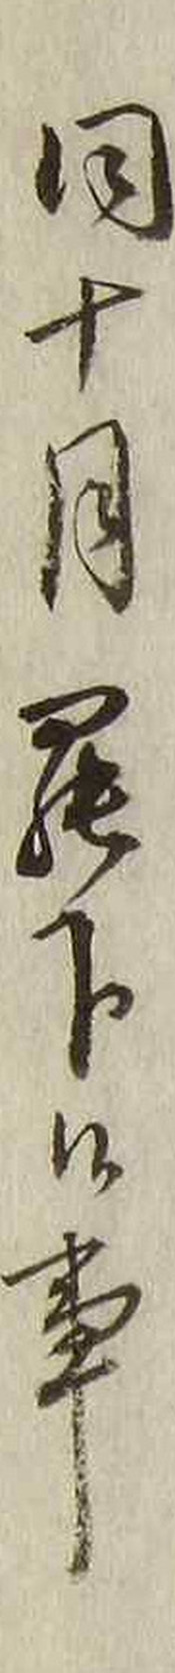同十月罷下候事
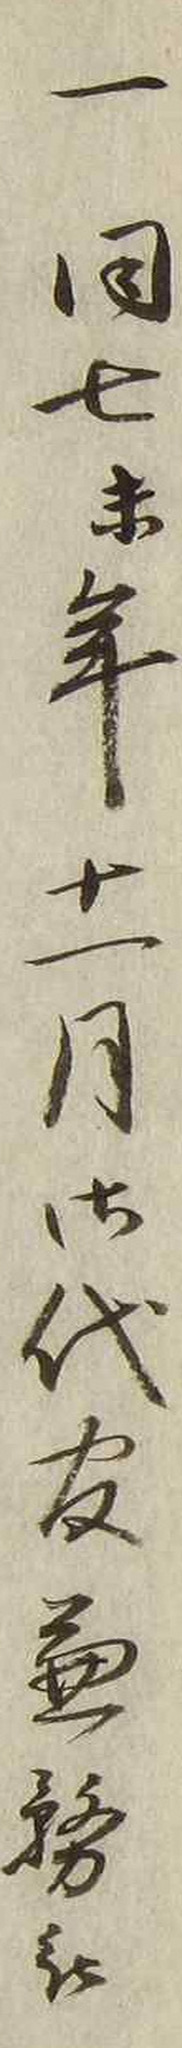一同七未年十一月御代官兼務被
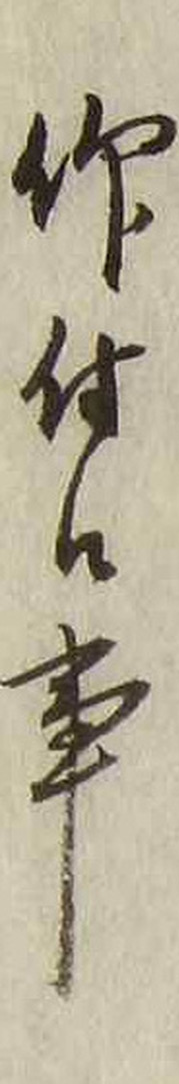仰付候事

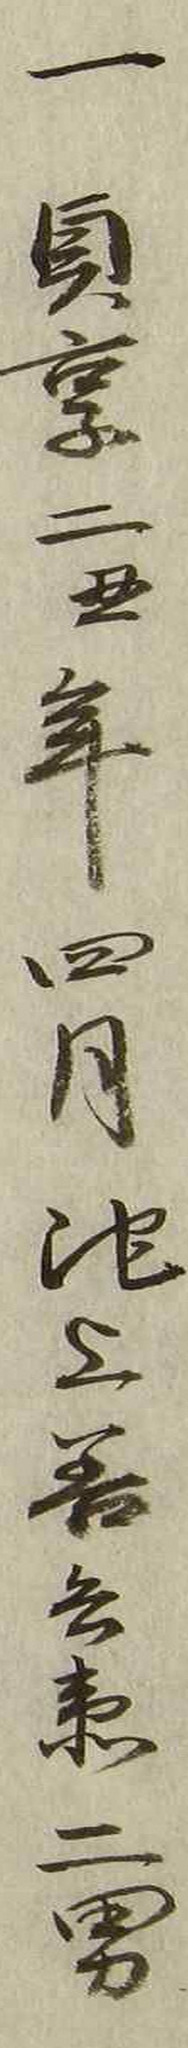一貞享二丑年四月池上善兵衛二男
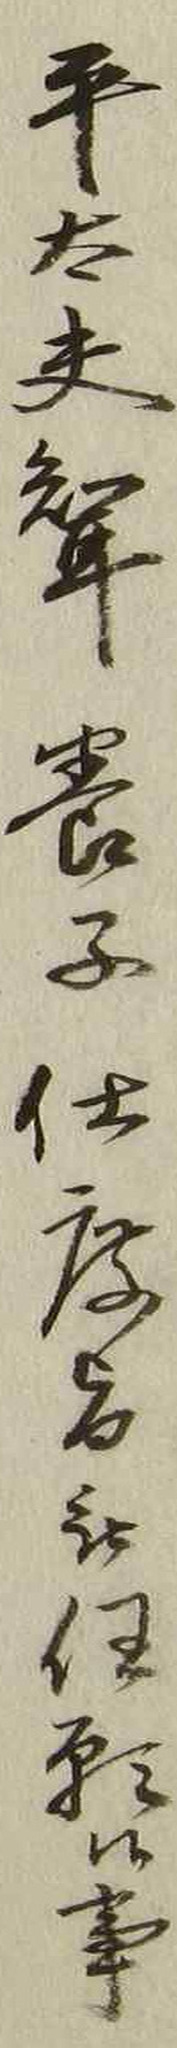平太夫婿養子仕度旨被任願候事
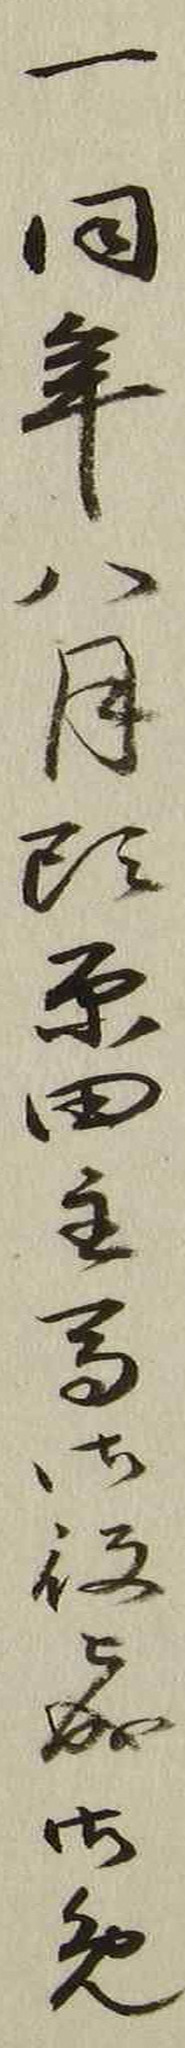一同年八月頭原田主馬御役被成御免
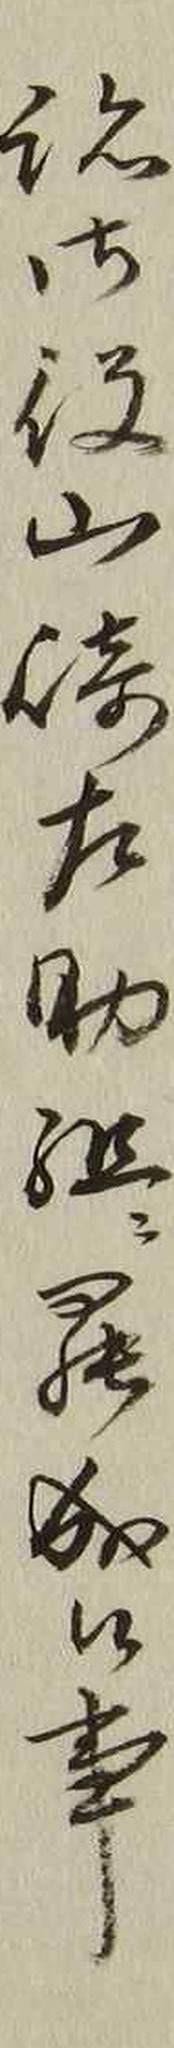跡御役山崎左助組ニ罷成候事
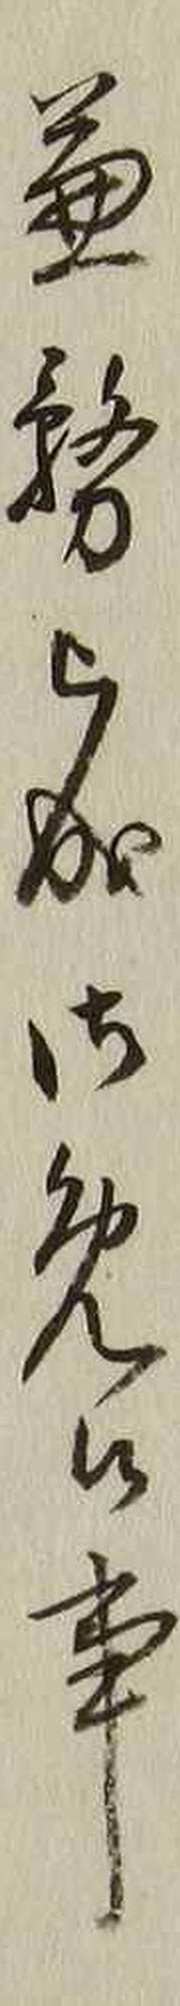兼務被成御免候事
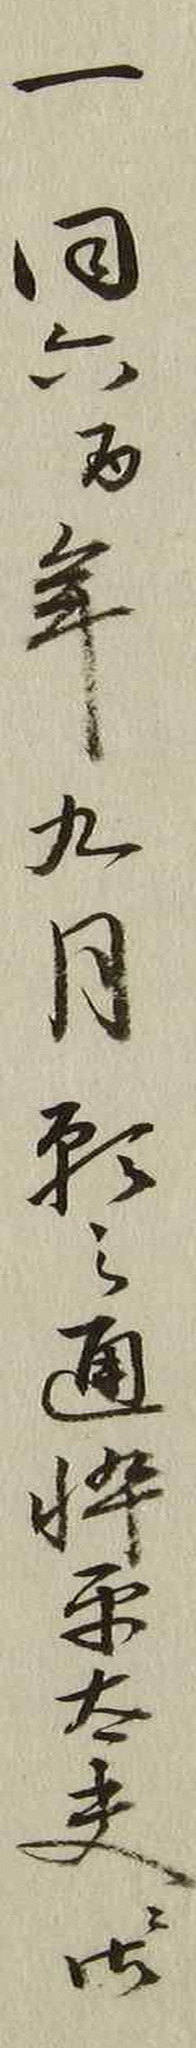一同六酉年九月願之通忰平太夫ニ御
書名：諸士系譜　巻之128　た之部4
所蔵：会津若松市立会津図書館
